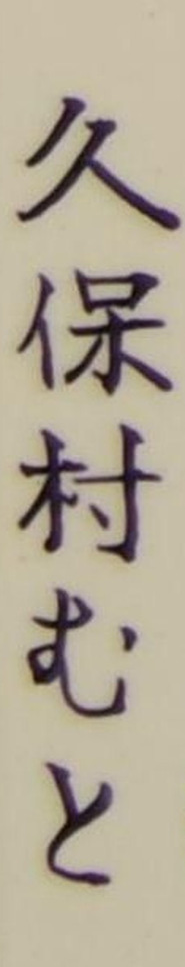久保村むと

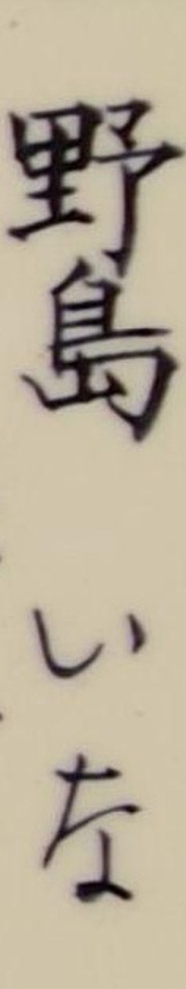野島いな
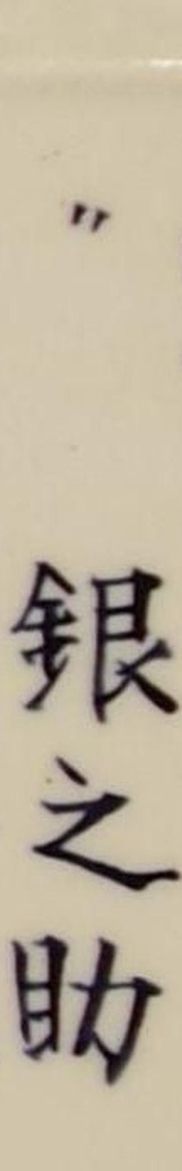銀之助
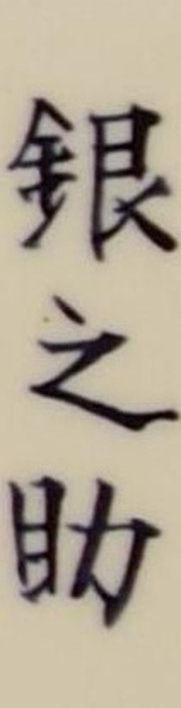銀之助
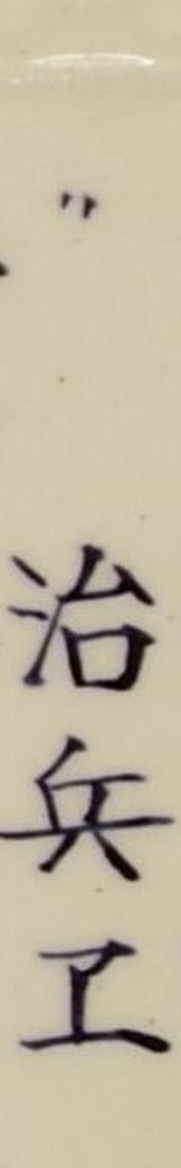治兵ヱ
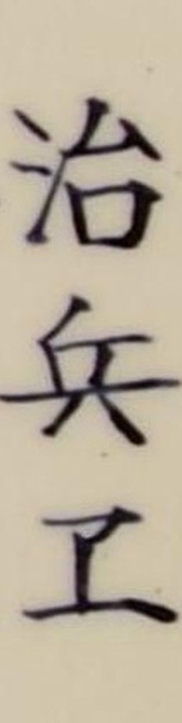治兵ヱ
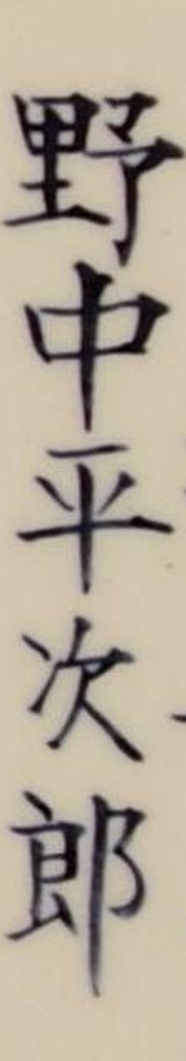野中平次郎
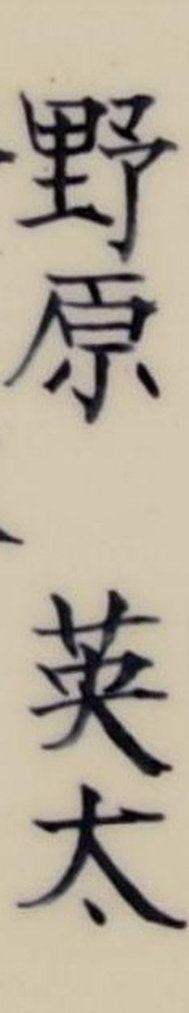野原英太
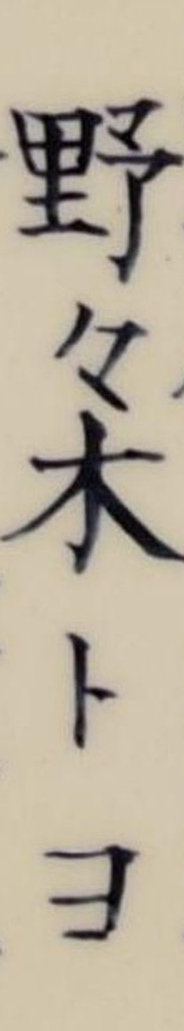野々木トヨ
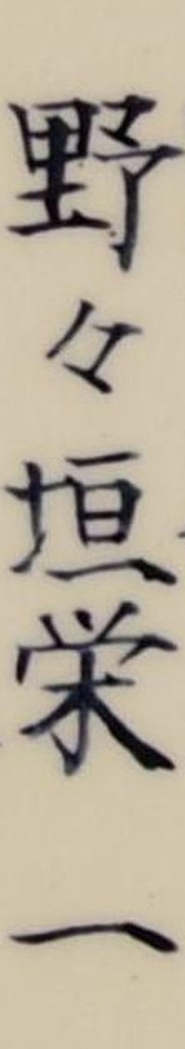野々垣栄一
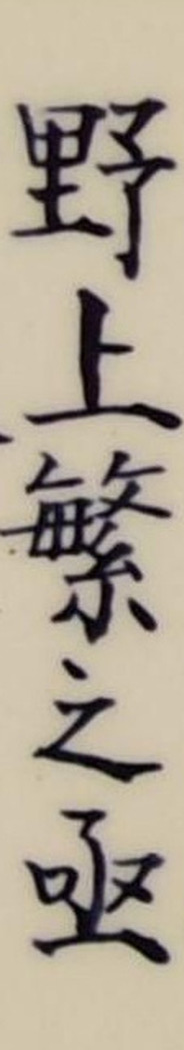野上繁之丞
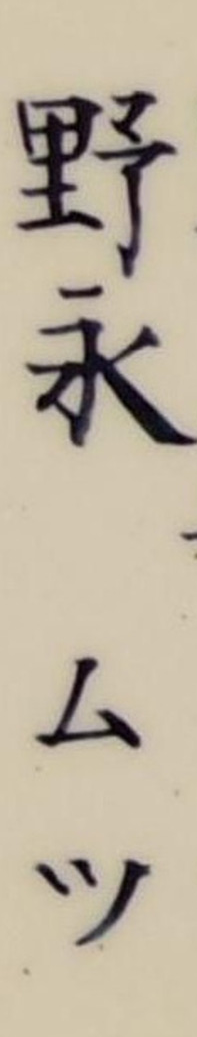野永ムツ
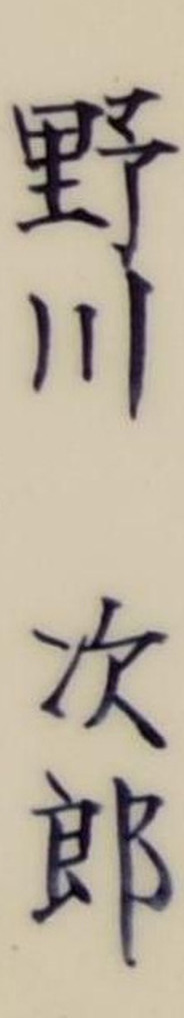野川次郎
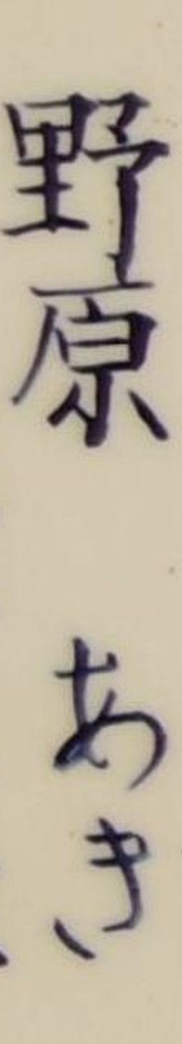野原あき
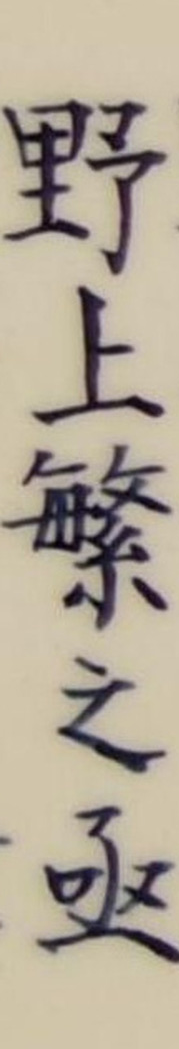野上繁之丞
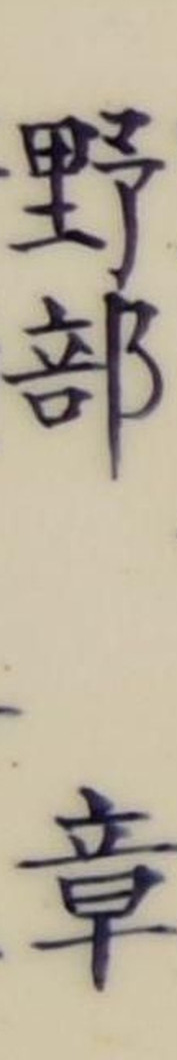野部章
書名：A~D
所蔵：koyasan kongobuji
